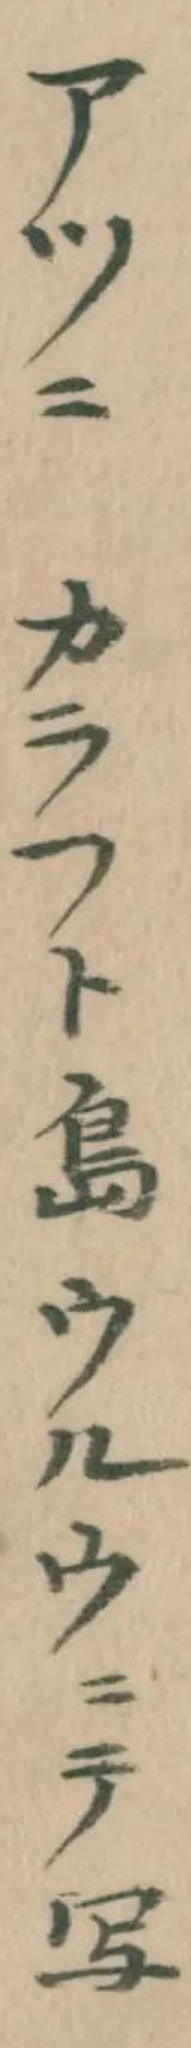アツニカラフト島ウルウニテ写
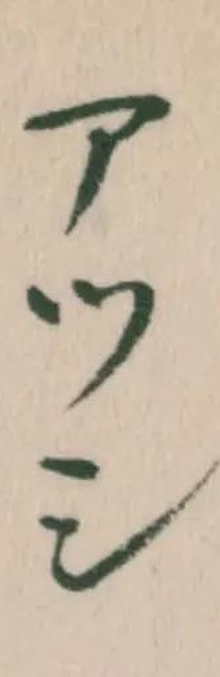アツシ

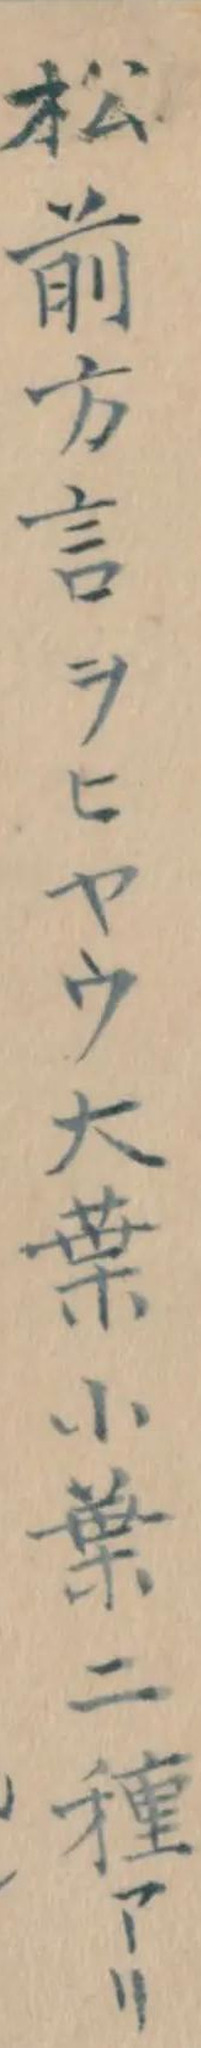松前方言ヲヒヤウ大葉小葉二種アリ
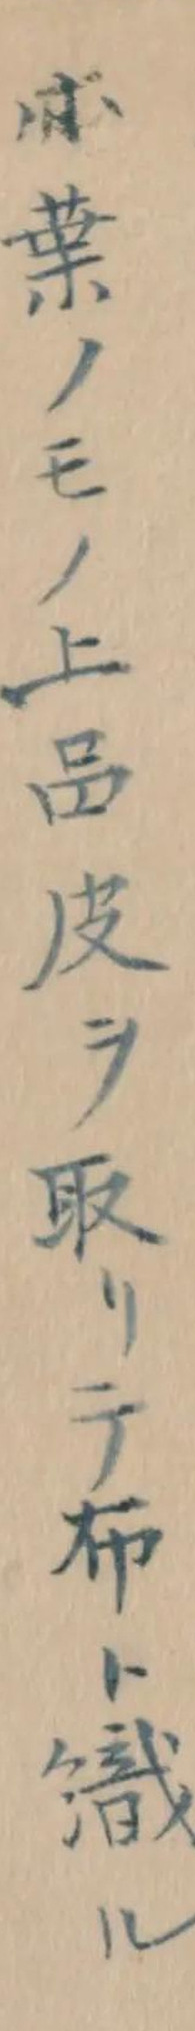小葉ノモノ上品皮ヲ取リテ布ト織ル
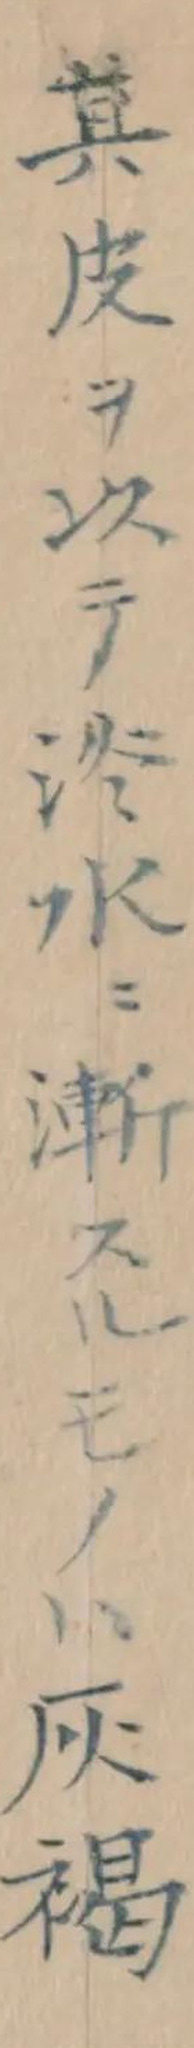其皮ヲ以テ淡水ニ漸スルモノハ灰褐
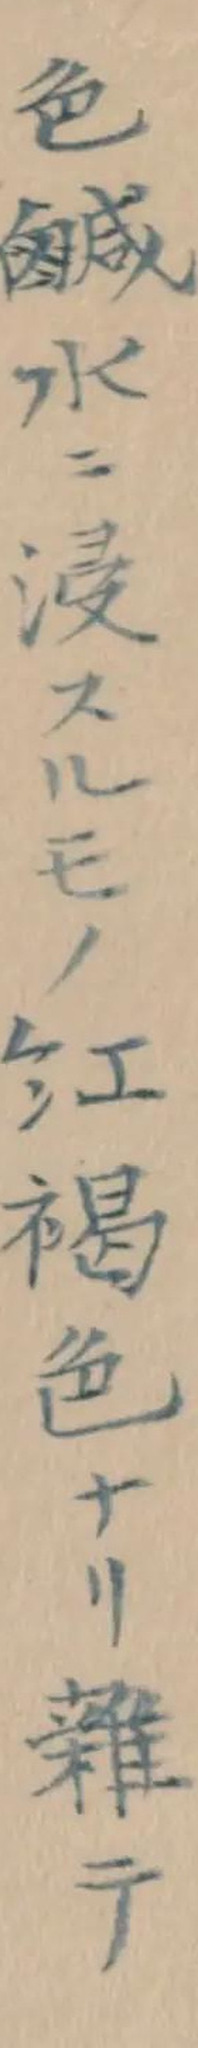色鹹水ニ浸スルモノ紅褐色ナリ雑テ
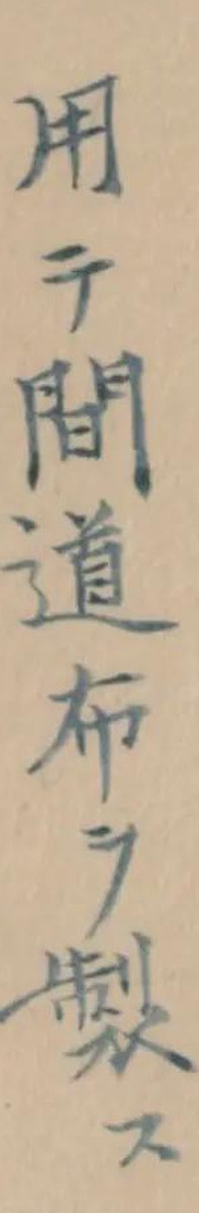用テ間道布ヲ製ス
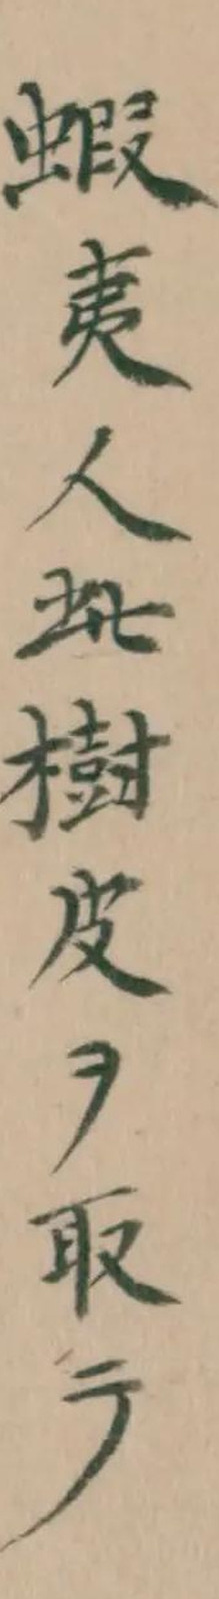蝦夷人此樹皮ヲ取テ
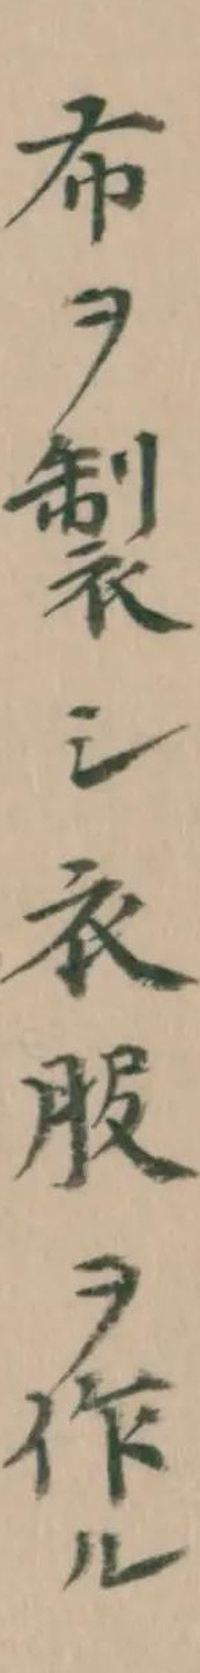布を製シ衣服ヲ作ル

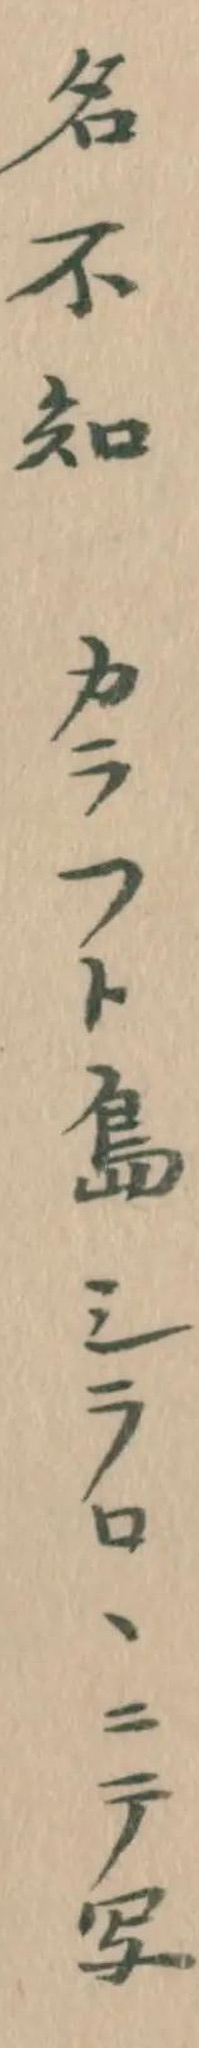名不知カラフト島シラロヽ二テ写
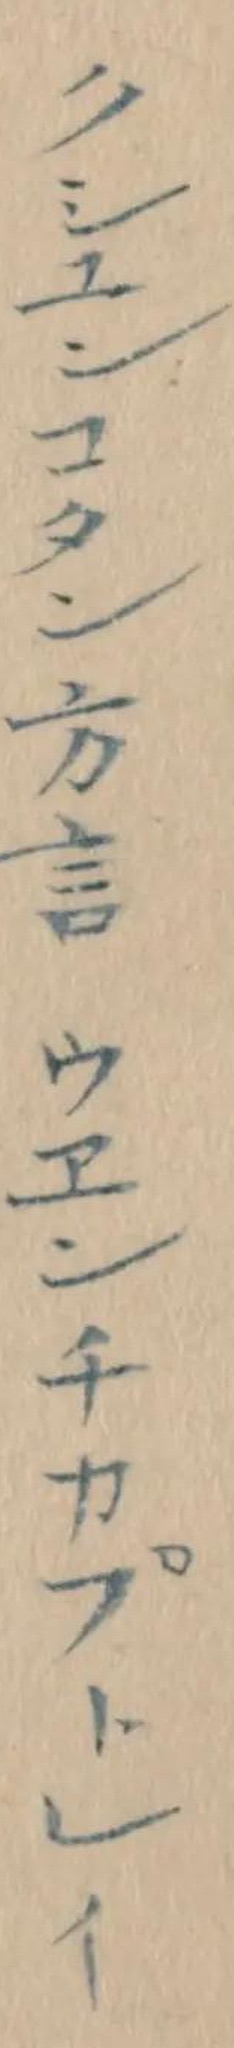クシユンコタン方言ウエンチカプトレイ
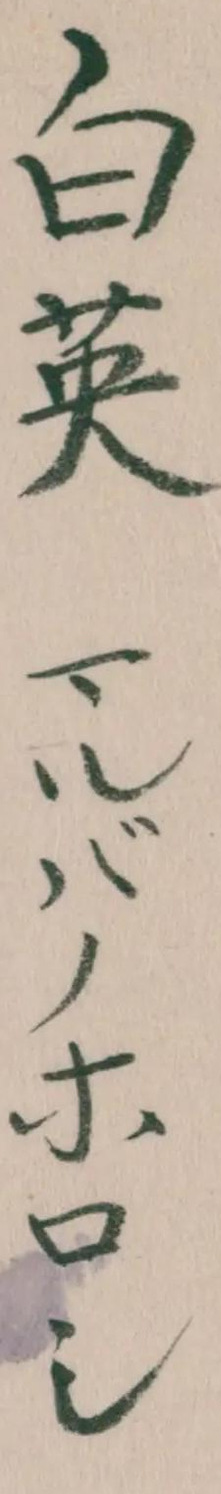白英マルバノホロシ
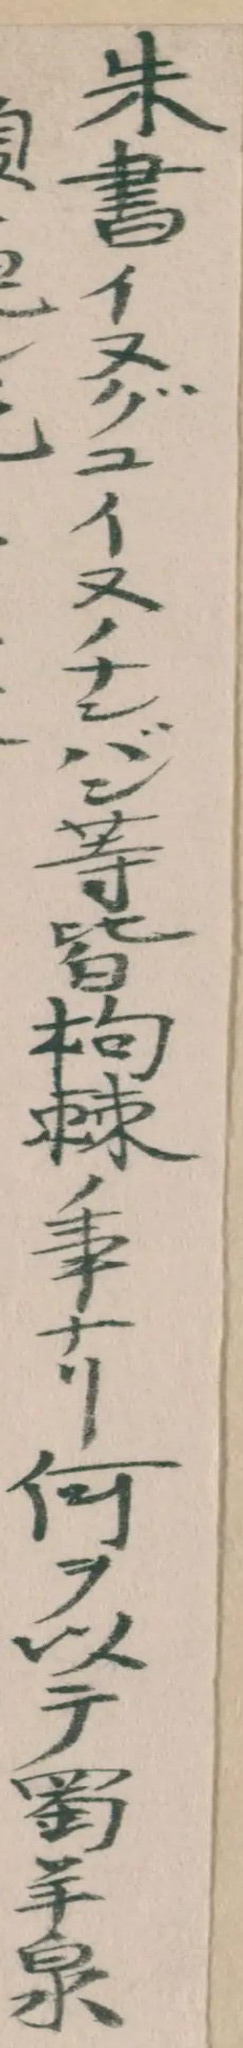朱書イヌグコイヌノナンバン等皆枸棘ノ事ナリ何ヲ以テ蜀羊泉
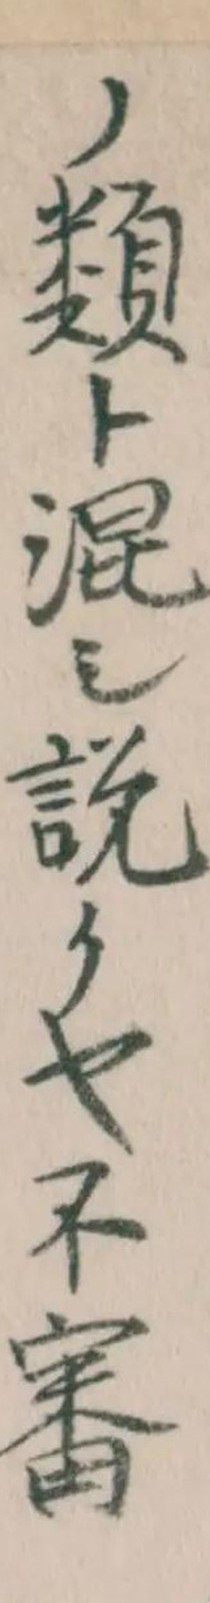ノ類ト混シ説クヤ不審

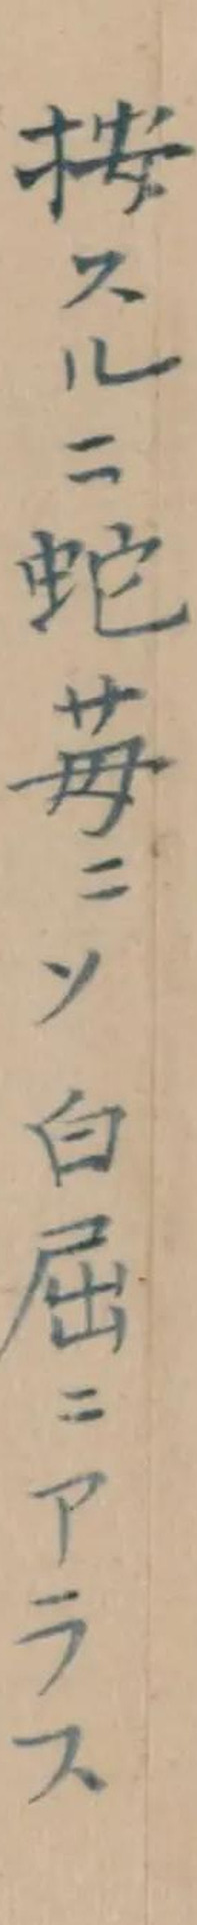按スルニ蛇苺ニシテ白屈ニアラス
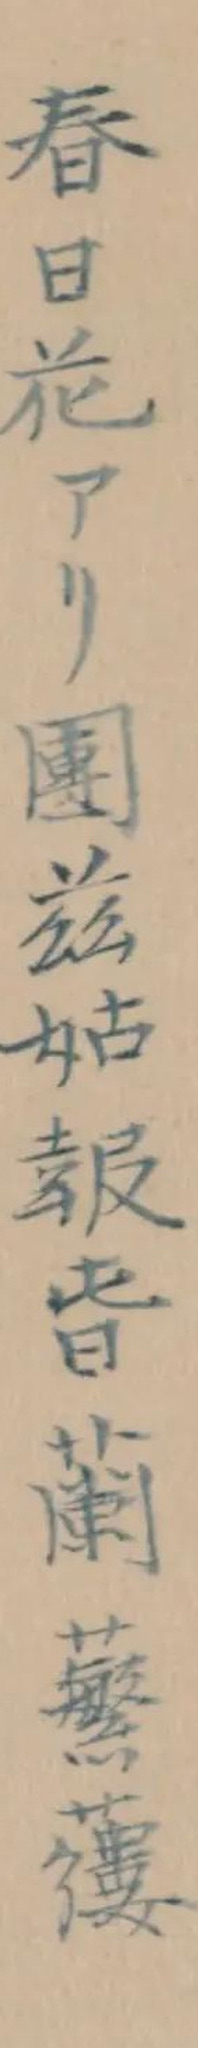春日花アリ団茲姑報春蘭蘩𧃒
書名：蝦夷草木図
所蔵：国立国会図書館 National Diet Library, JAPAN
